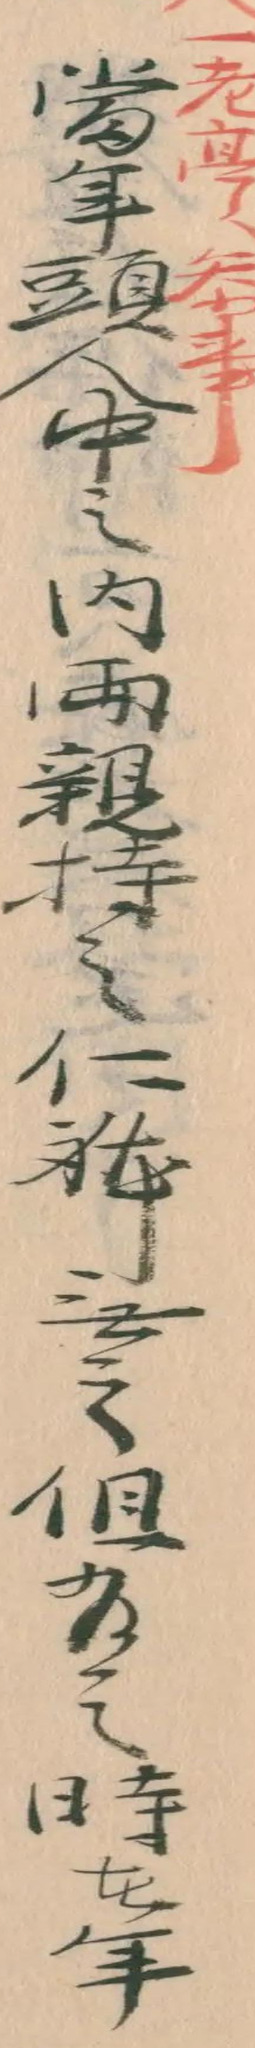一當年頭人中之内両親持之仁躰無之但有之時在年
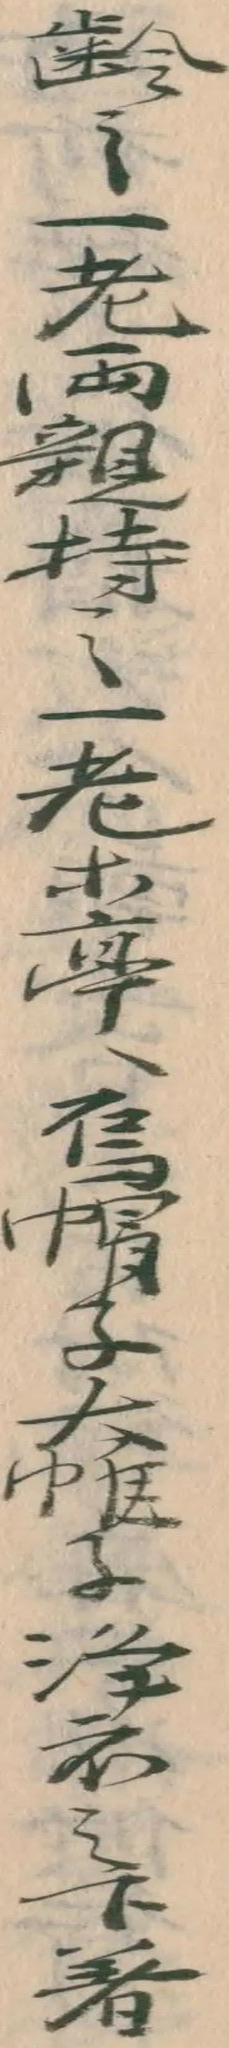齢之一老両親持之一老等亭へ烏帽子大帷子浄衣之下着
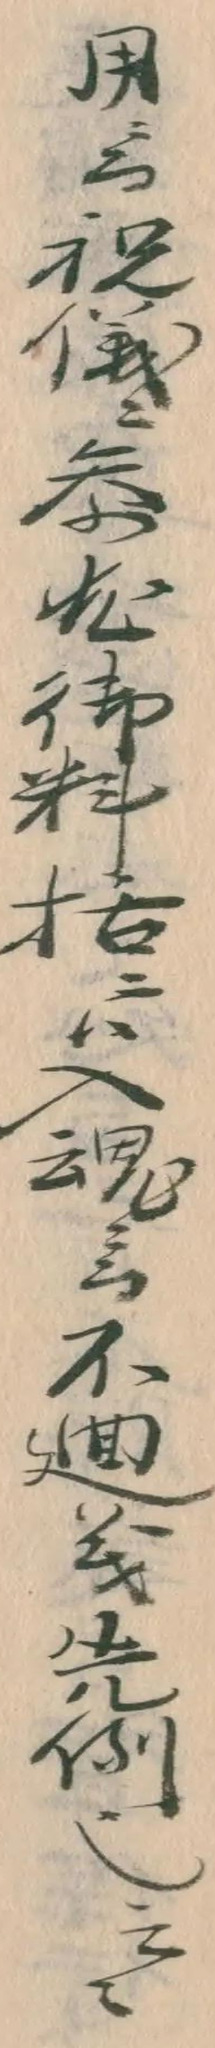用ニ而祝儀ニ参尤御料括ニハ入魂ニ而不廻義先例也云々
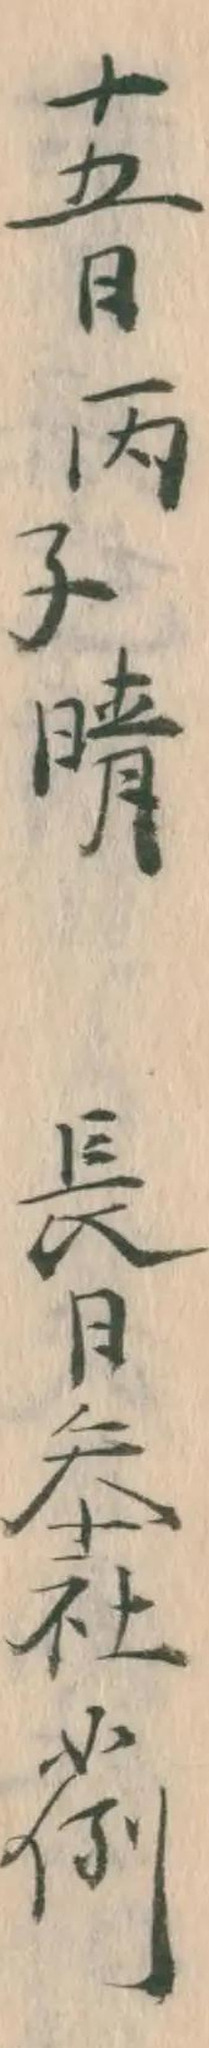十五日丙子晴長日参社如例
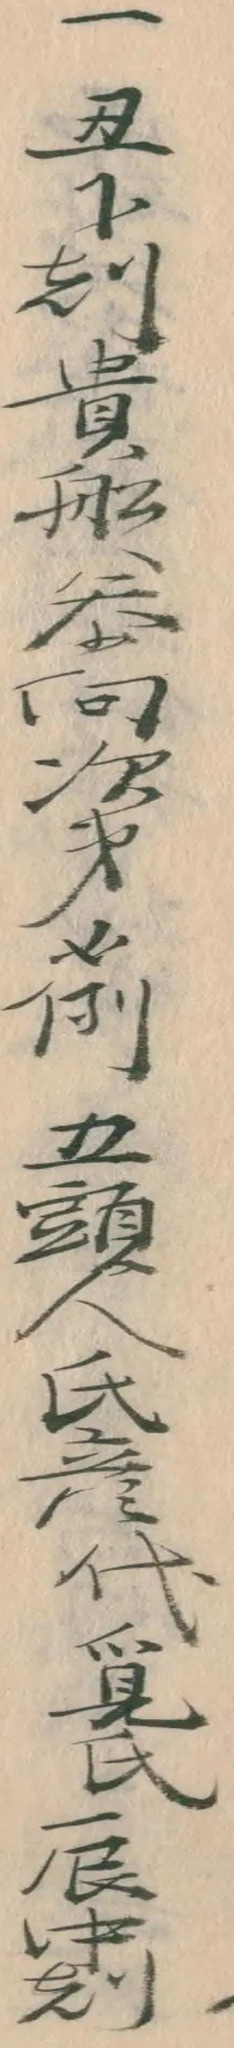一丑下刻貴舩へ参向次第如例五頭人氏彦代覓氏辰中刻
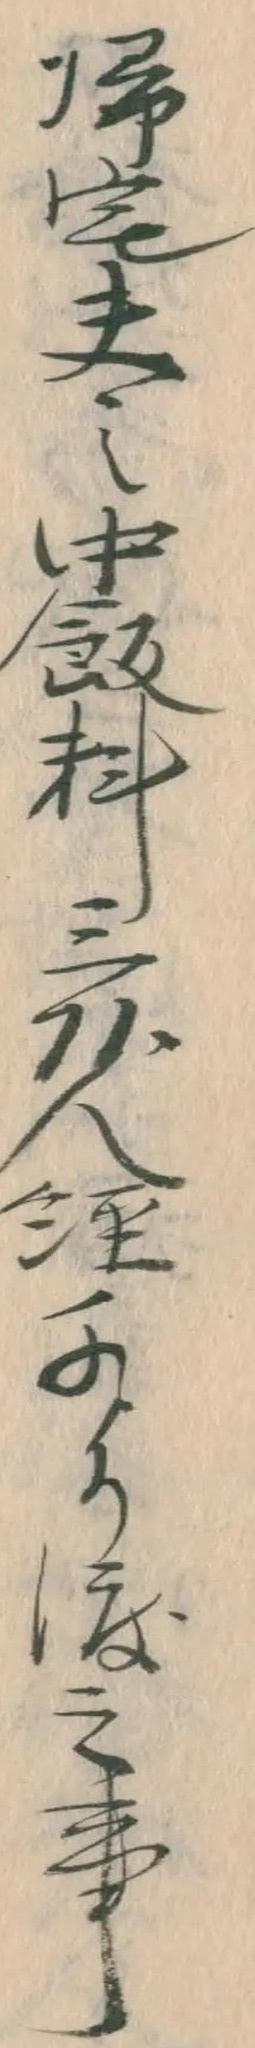帰宅夫之中飯料三頭人経千より渡之事
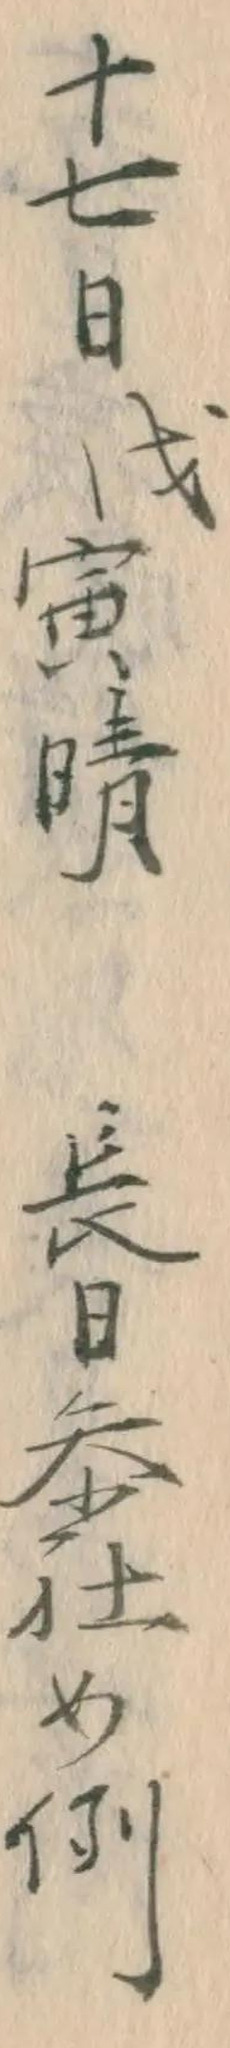十七日戊寅晴長日参社如例
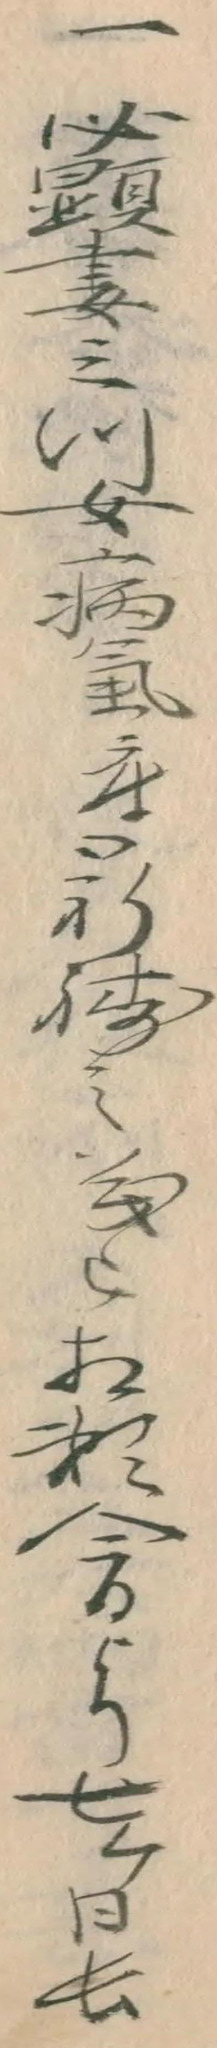一必顕妻ミつ女病氣ニ付御祈祷之義被相頼今日より七ケ日長
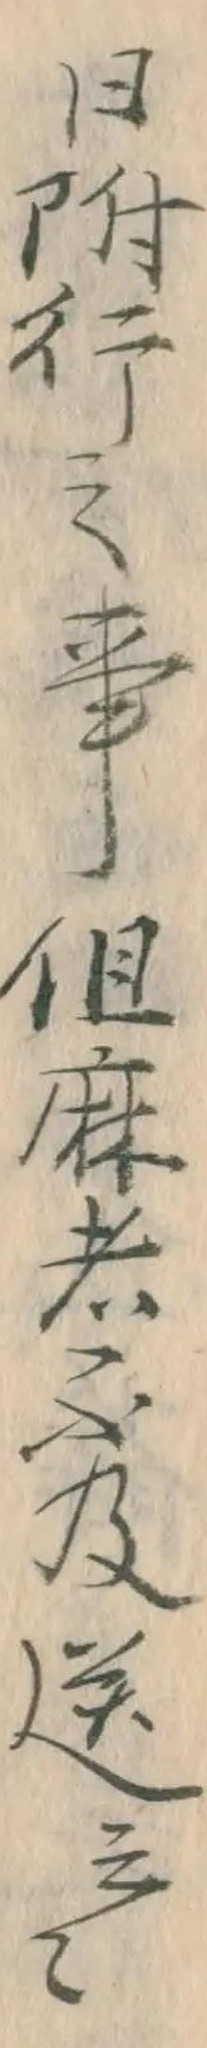日附行之事但麻者不及送云々

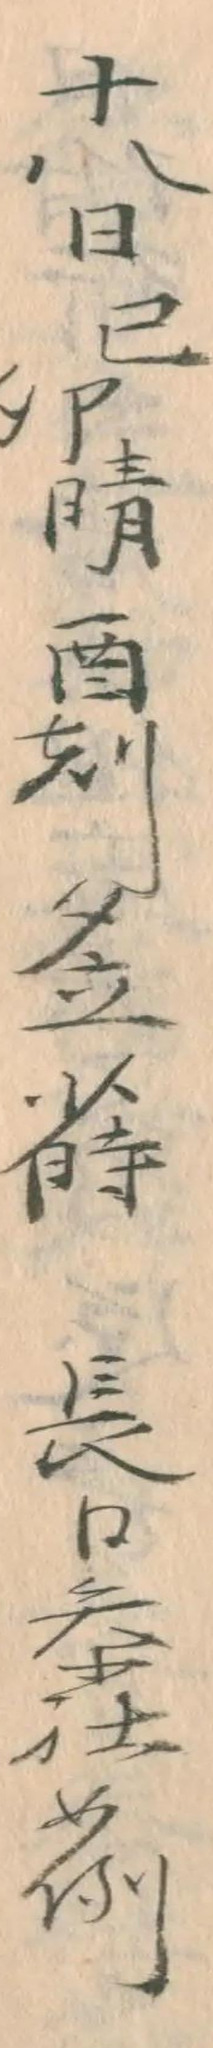十八日己卯晴酉刻夕立少時長日参社如例
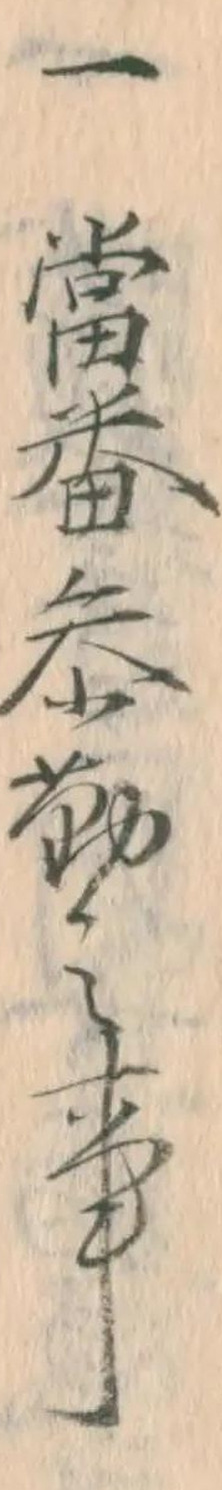一當番参勤之事
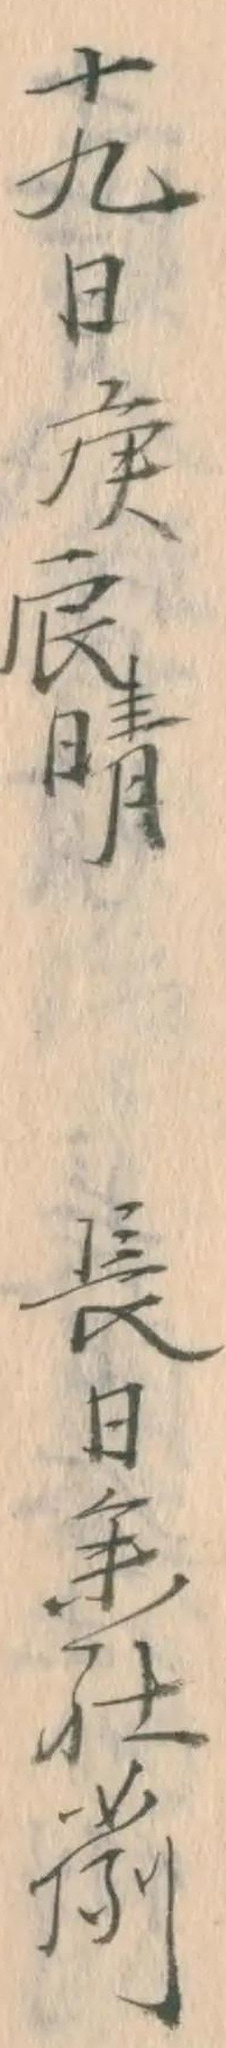十九日庚辰晴長日参社如例
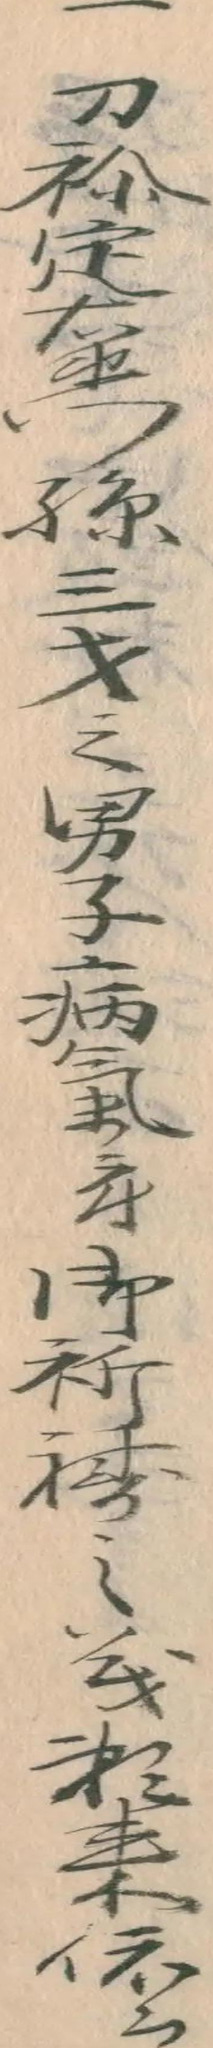一刀祢定右衛門孫三才也男子病氣ニ付御祈祷之義頼来依而
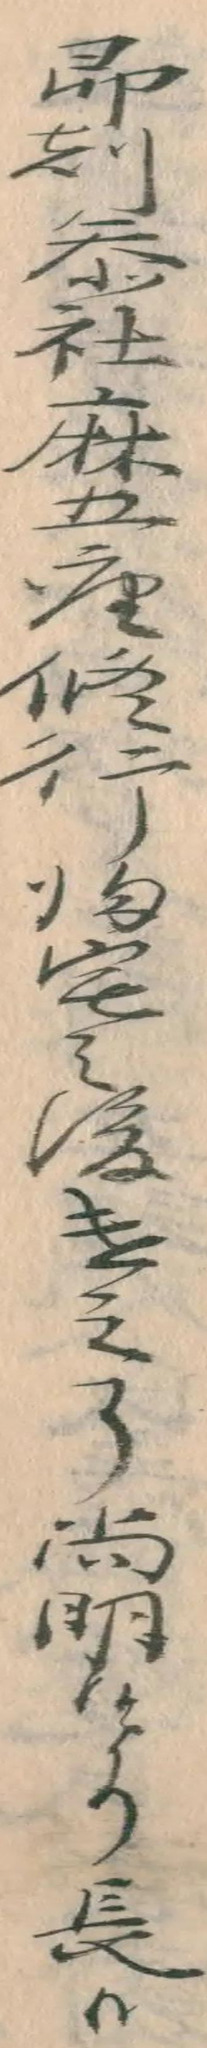即刻参社麻五座修行帰宅之後遣之了尚明日より長日
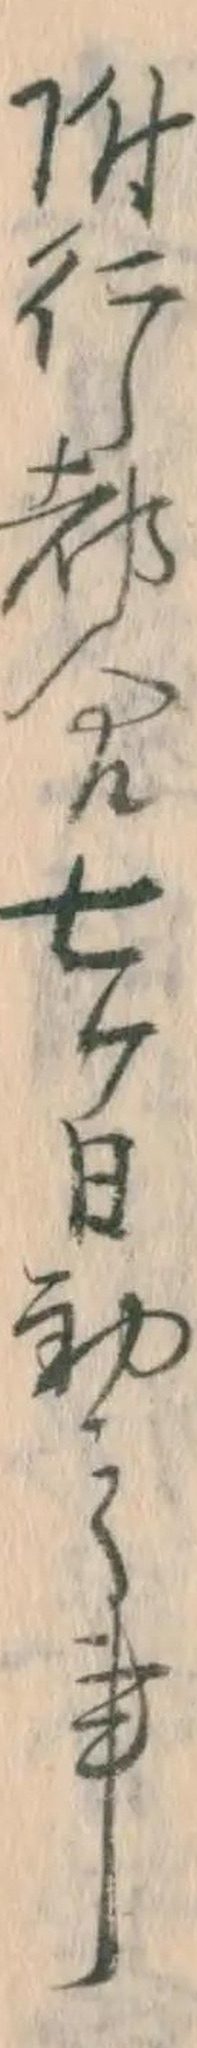附行都合七ヶ日初之事
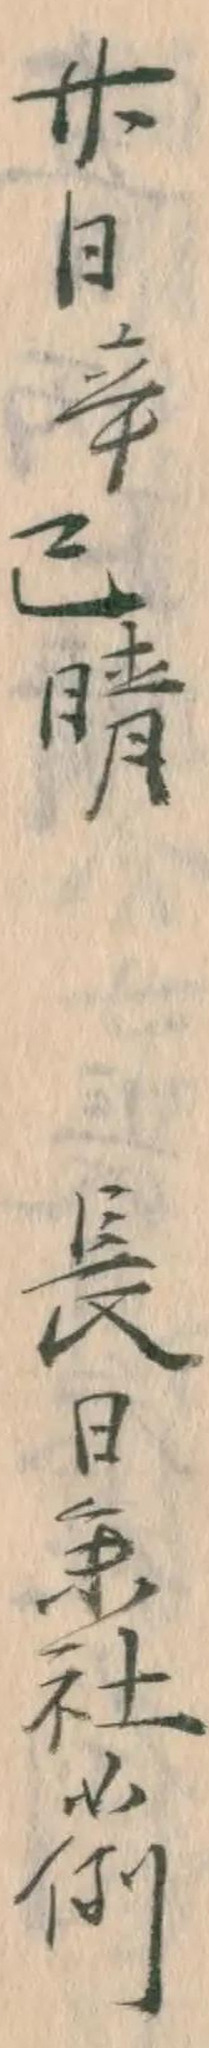廿日辛巳晴長日参社如例
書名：賀茂社記録. 第73冊
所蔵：国立国会図書館 National Diet Library, JAPAN
